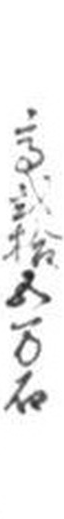高弐拾五万石
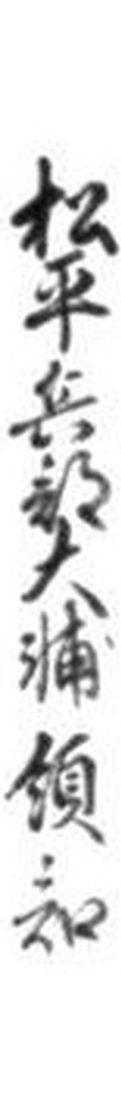松平兵部大輔領知
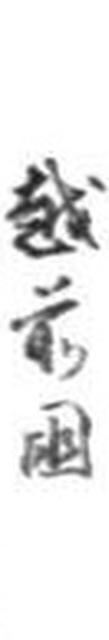越前国
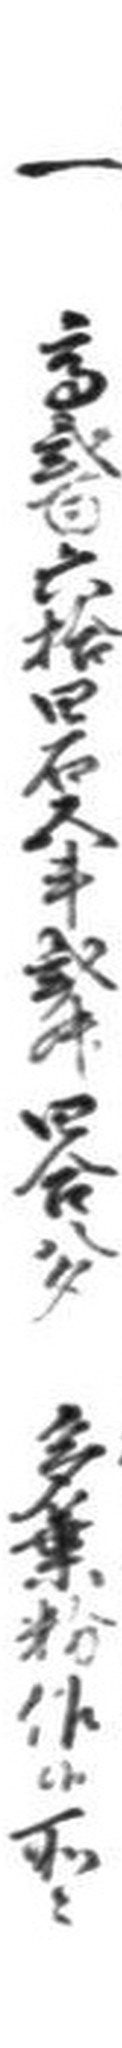一高弐百六拾四石五斗弐升四合八勺元禄十五午年
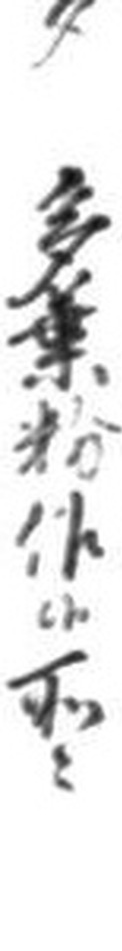多葉粉作候所々
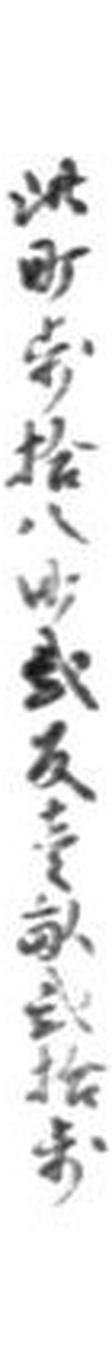此町歩拾八町弐反壱畝弐拾歩
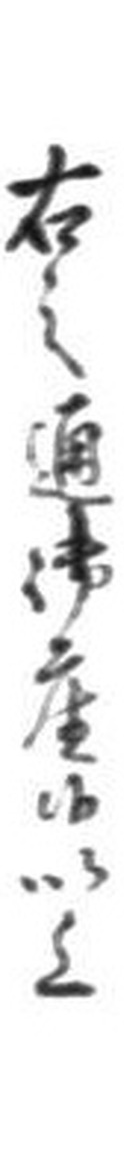右之通御座候以上
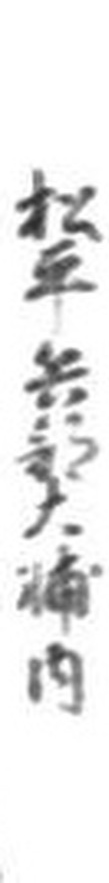松平兵部大輔領知
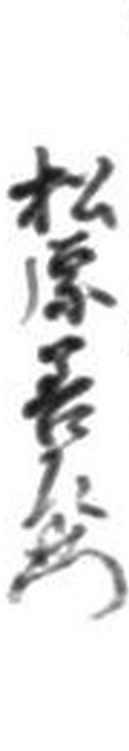松原善左衛門

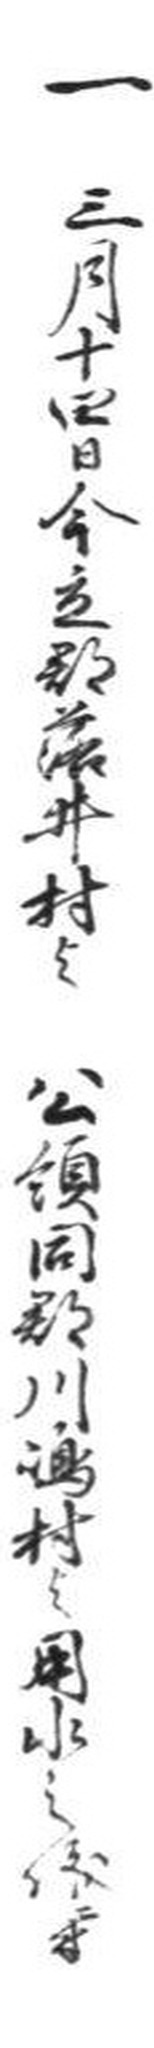一三月十四日今立郡落井村与公領同郡川嶋村与用水之儀ニ付
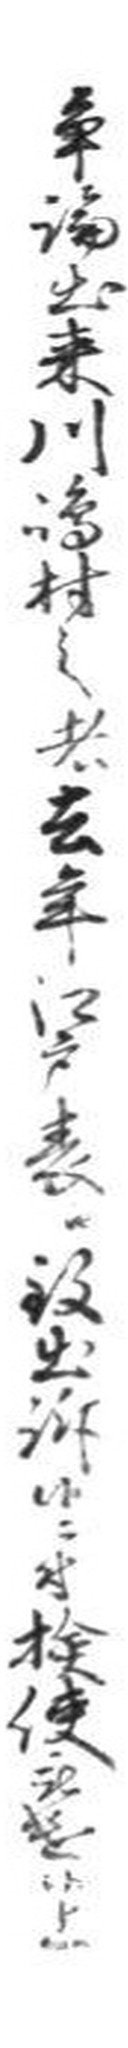争論出来川嶋村之者去年江戸表江致出訴候ニ付検使被遣候上
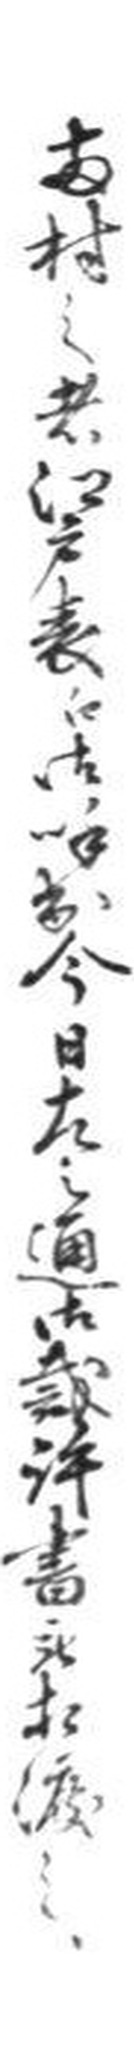両村之者江戸表江御呼出今日左之通御裁許書被相渡之
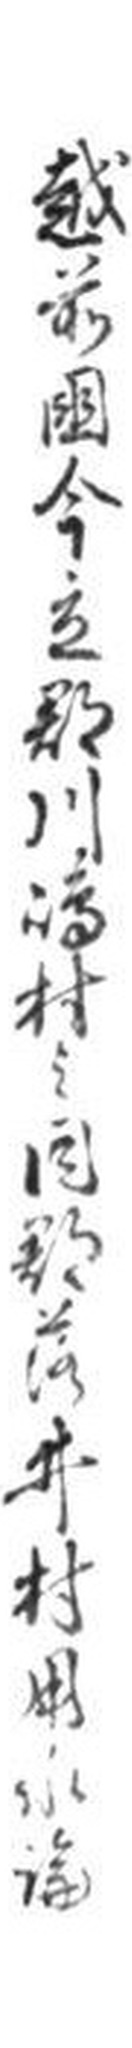越前国今立郡川嶋村与同郡落井村用水論
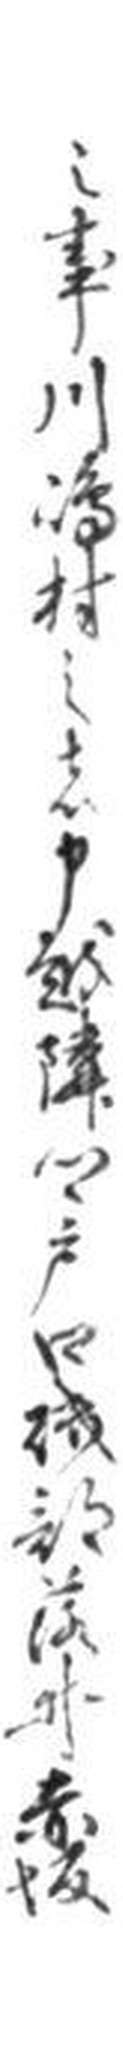之事川嶋村之者申越隣郷戸口磯部落井赤坂
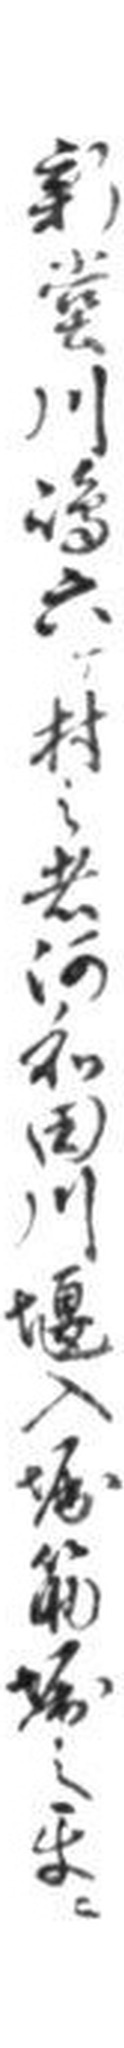新堂川嶋六ケ村之者河和田川堰入堀筋堀之互ニ
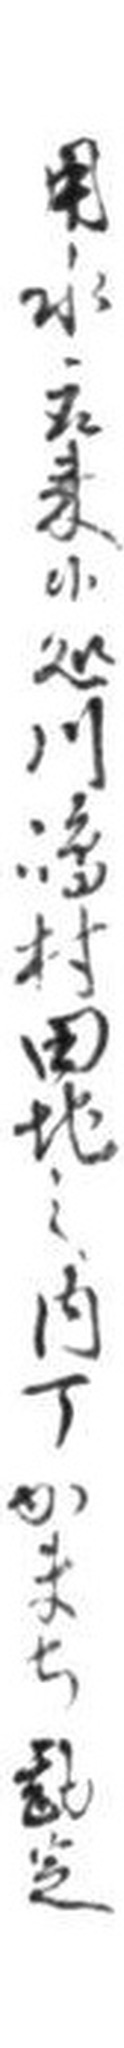用水取来候処川嶋村田地之内丁かまち勘定
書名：家譜 二十二 吉品公 従元禄十五年到同十六年
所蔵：福井県文書館 Fukui Prefectural Archives
